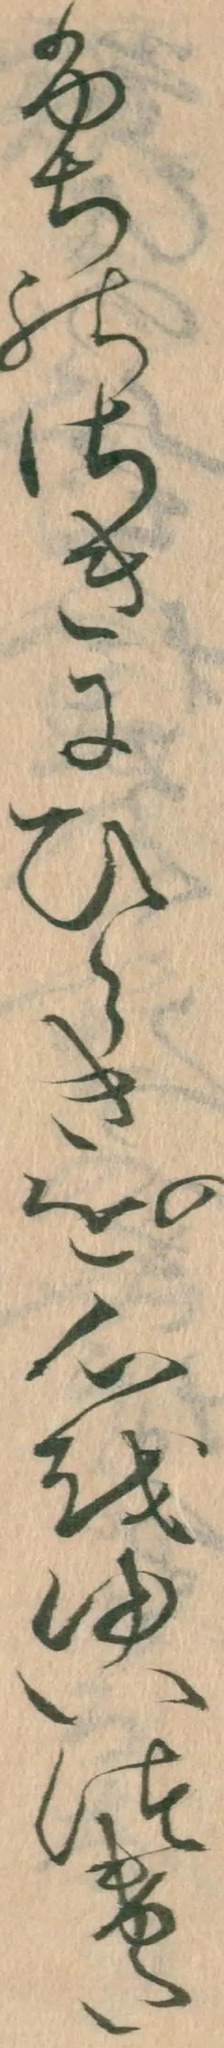ふちのさきにひらきを心をゆいつけた
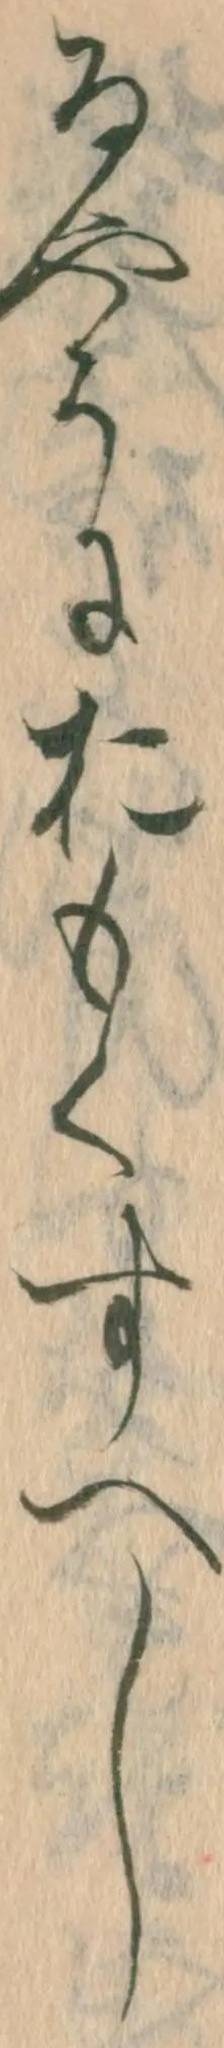るやうにおもくすへし
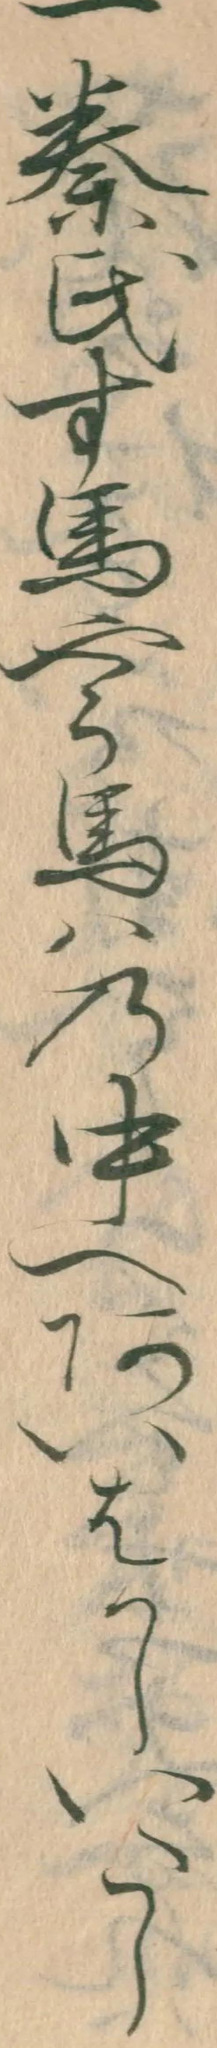一秦氏す馬やう馬はの中へあいはかしいたし
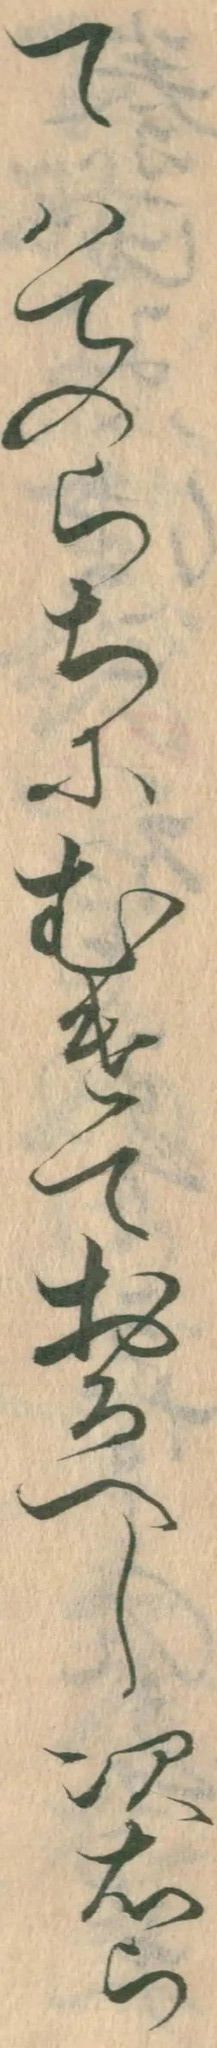てはてのらちにむけておるへし次右ら
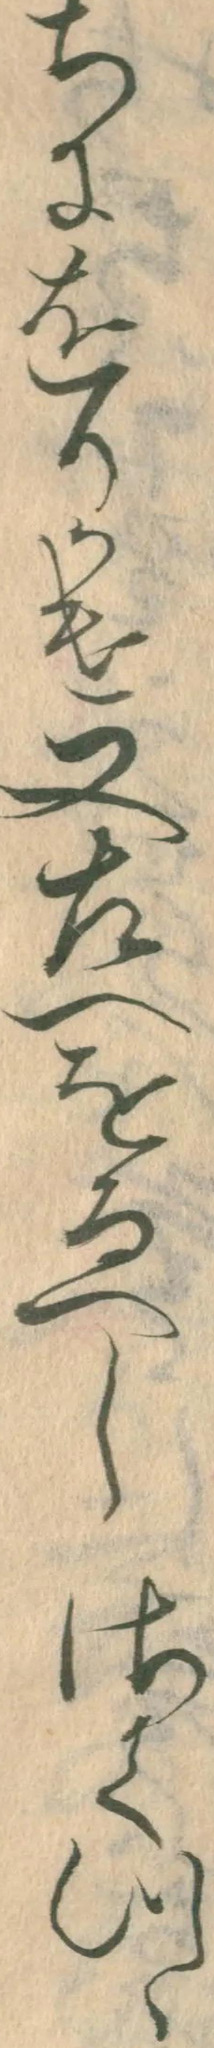ちにをりかけ又左へをるへしさてつゝ
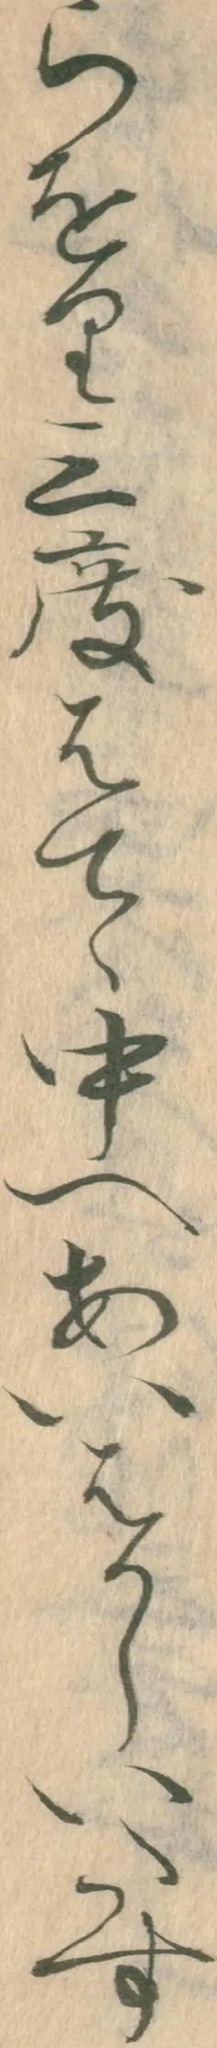らをり三度はてゝ中へあいはかしいたす
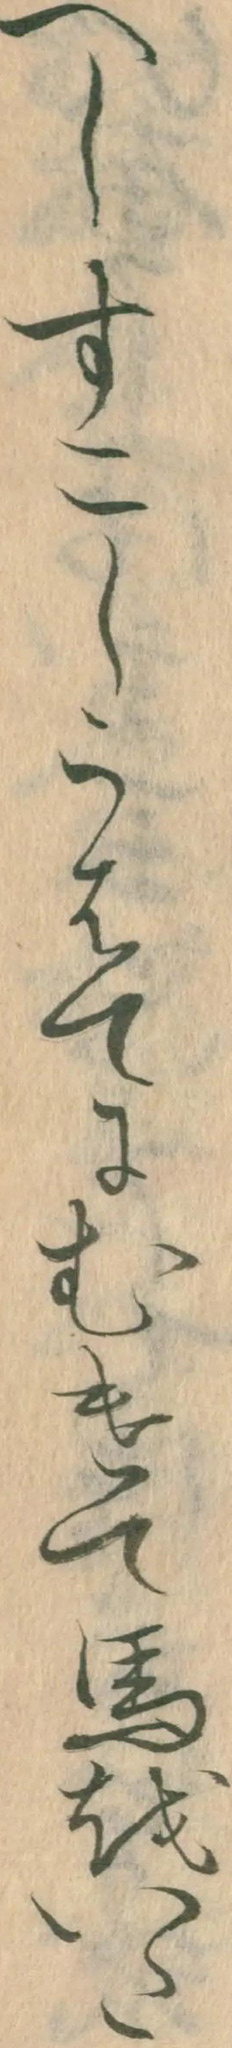へしすこしうはてにむけて馬をいた

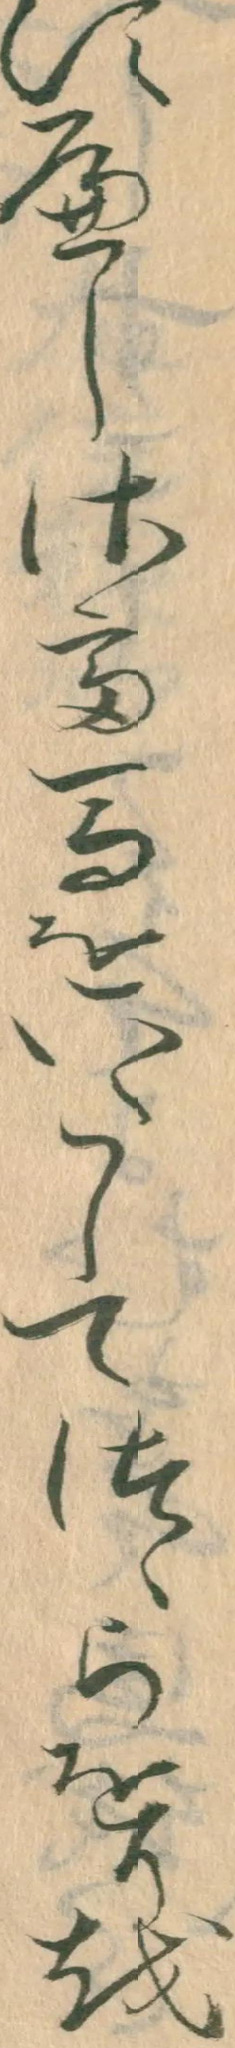すへしさて馬をいたしてつゝらをりを
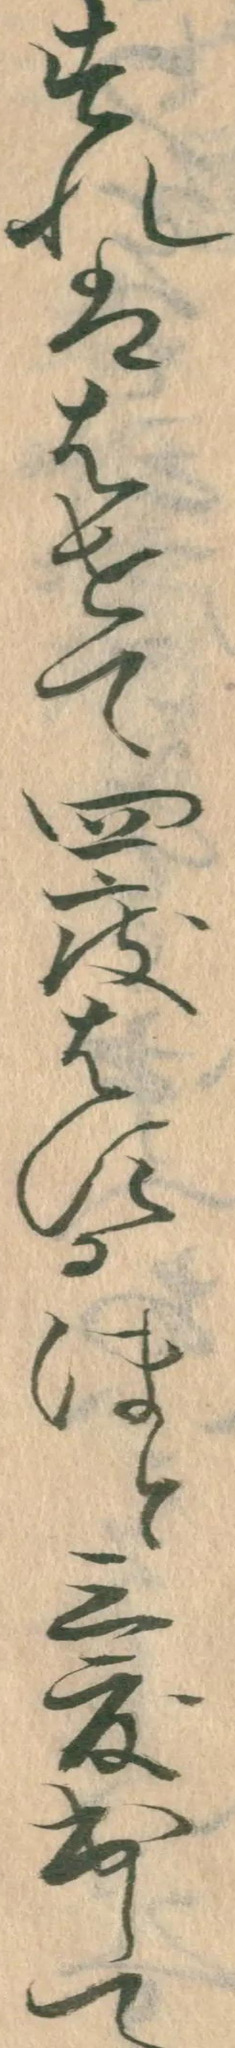すれははせて四度はするほと三度出して
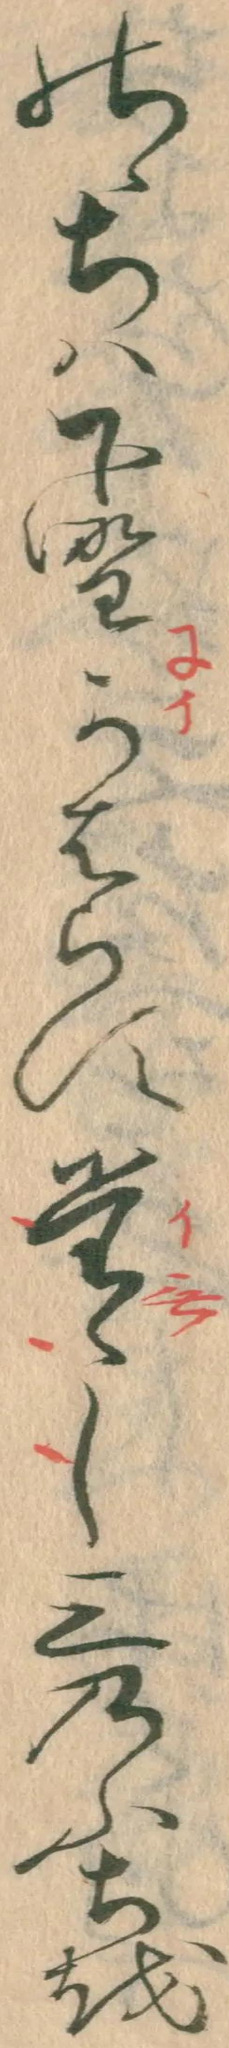のゝちは下野かはらす「たゝし」三のふちを
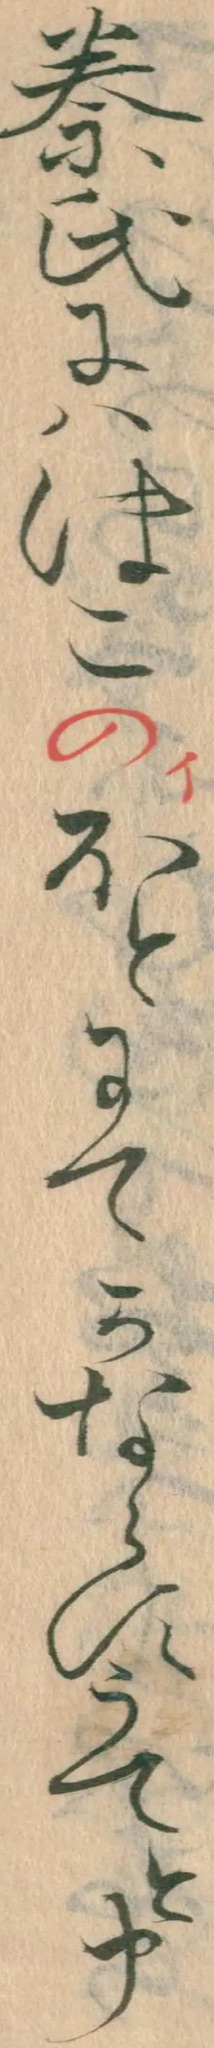秦氏にはほこのほとにてかならすうてと申
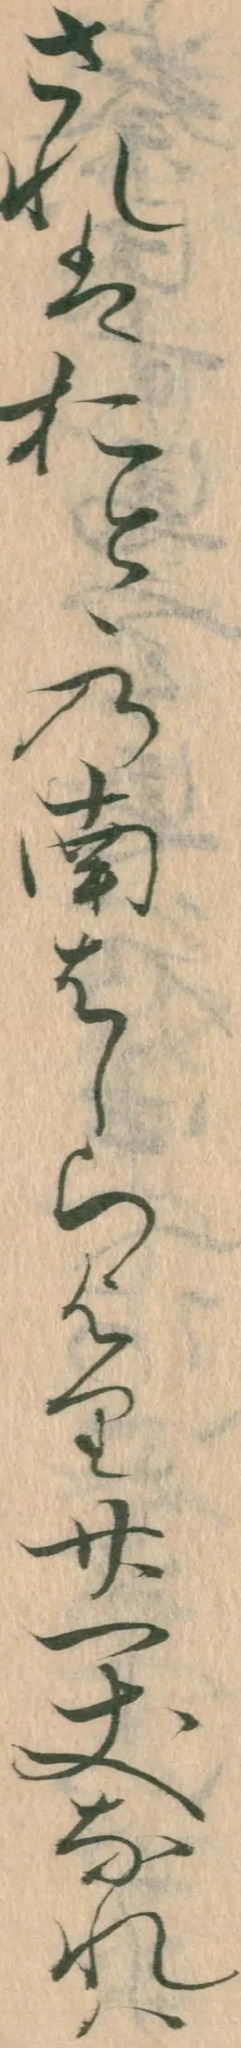されはおとゝの南はしらより廿一丈なれは
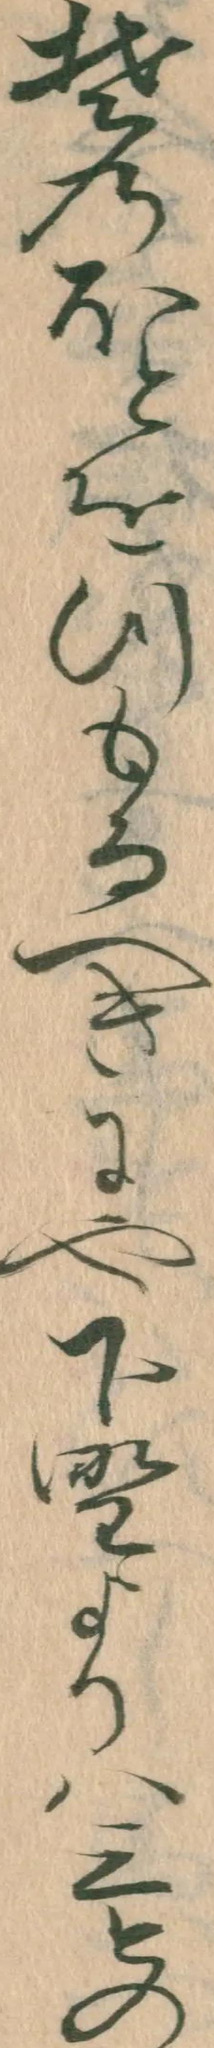そのほとをつもるへきにや下野よりは三との
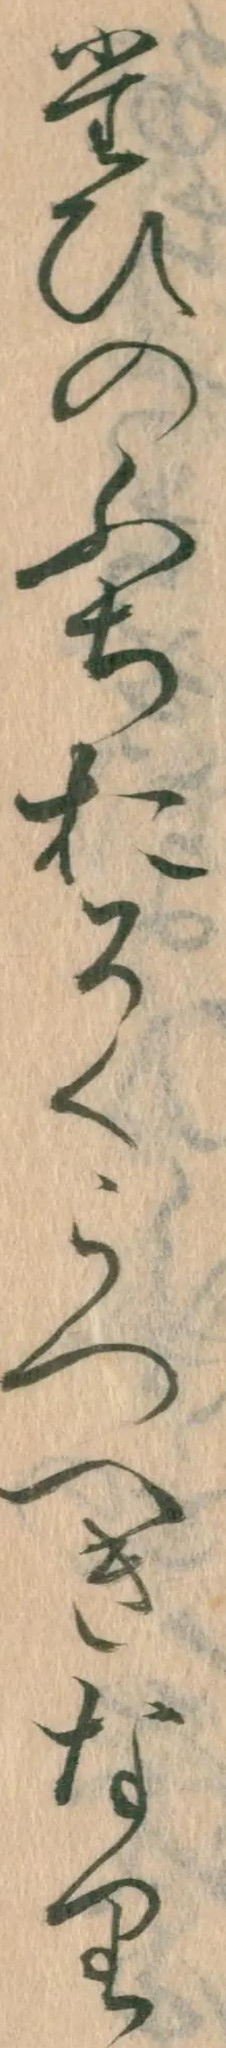たひのふちおそくうつへきなり
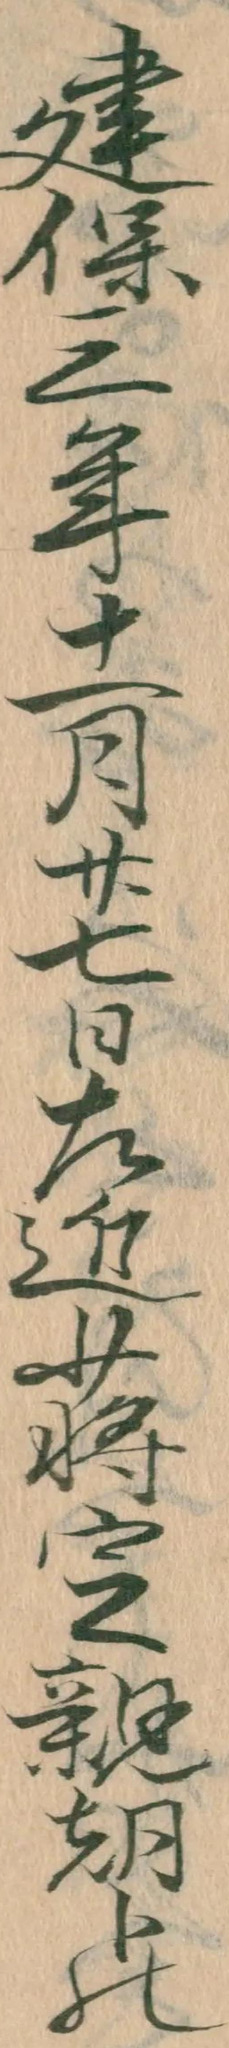建保三年十一月廿七日左近少将定親朝臣の
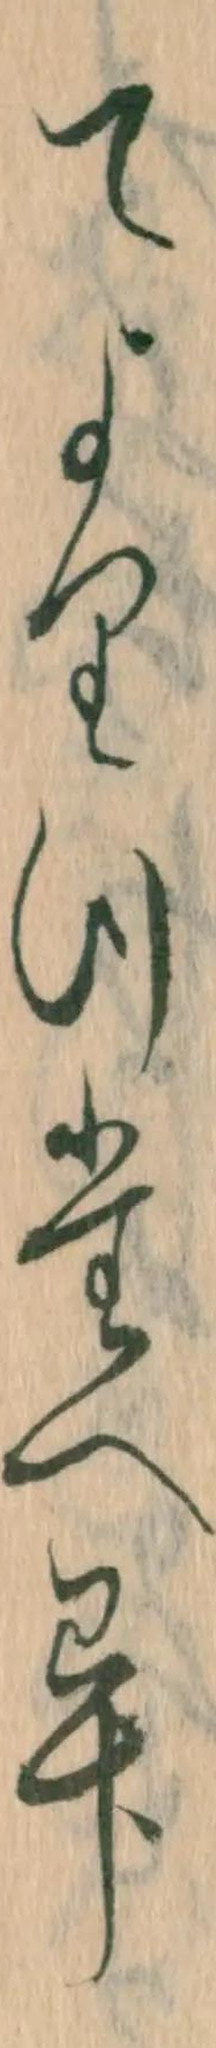てよりつたへ畢
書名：賀茂社記録. 第13冊
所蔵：国立国会図書館 National Diet Library, JAPAN
